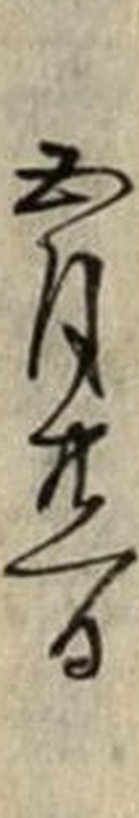五月廿一日
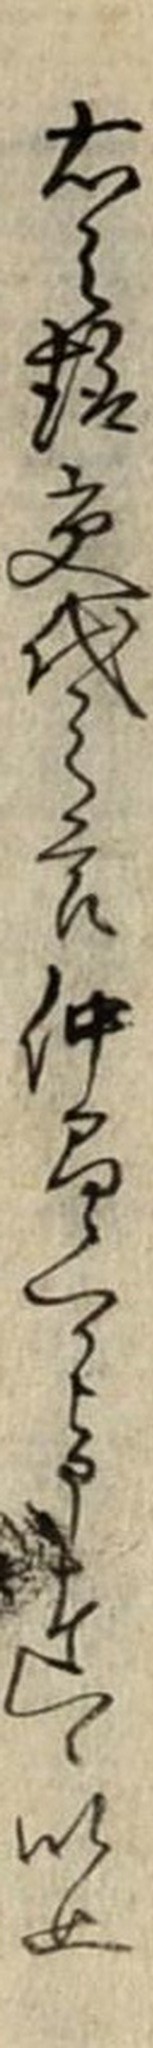右之趣交代之節仲間に可被申達候以上
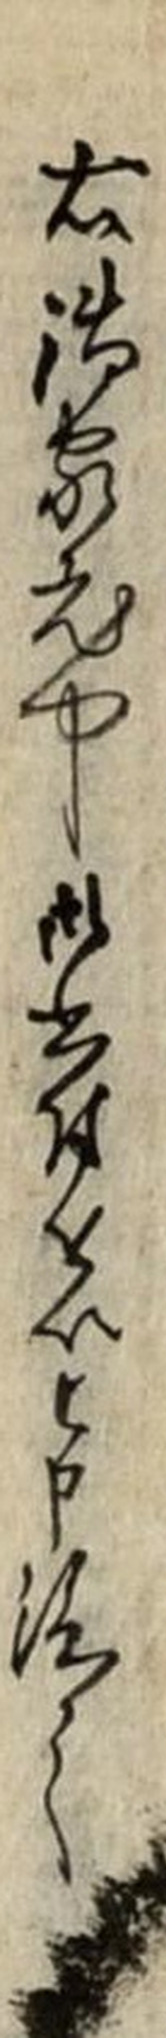右御家老中御書付を以被申渡之
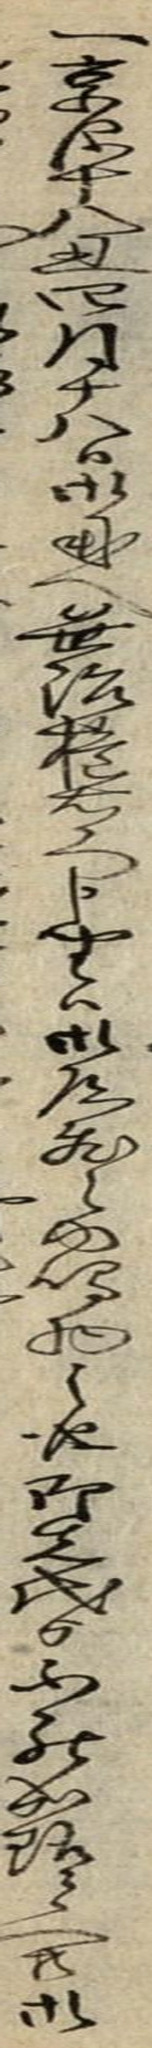一享保十八丑四月十八日御用人笹治権右衛門申聞候は御屋敷之内鳴物之儀御先代ゟ不罷成趣に候へ共御
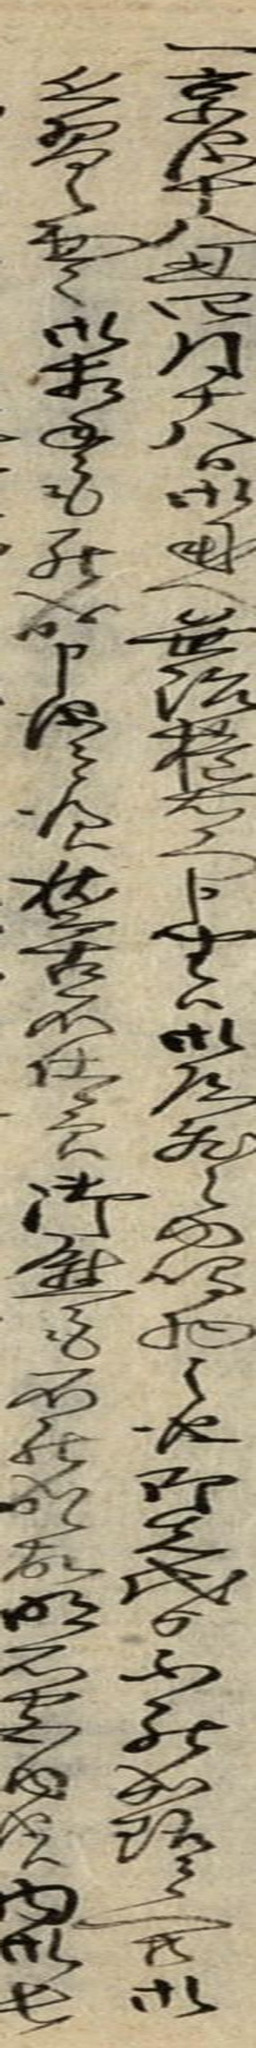近習之面々御相手にも罷成申儀に候得は稽古不仕候ては御慰にも不罷成候故明石宮内儀は内御長
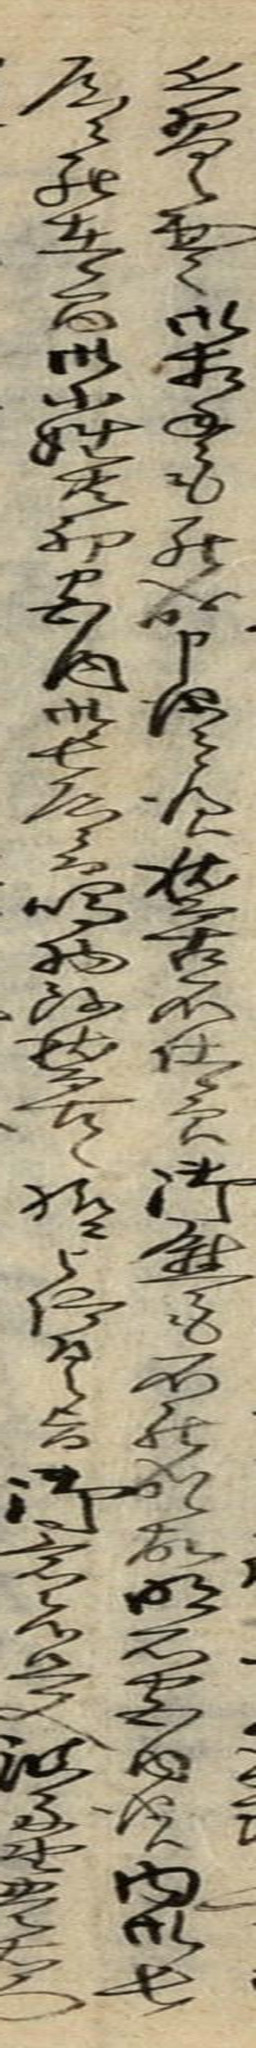屋に罷在候間御小姓共初宮内御長屋にて鳴物致稽古候様に被仰付候旨御意に候且又波多野豊右衛門
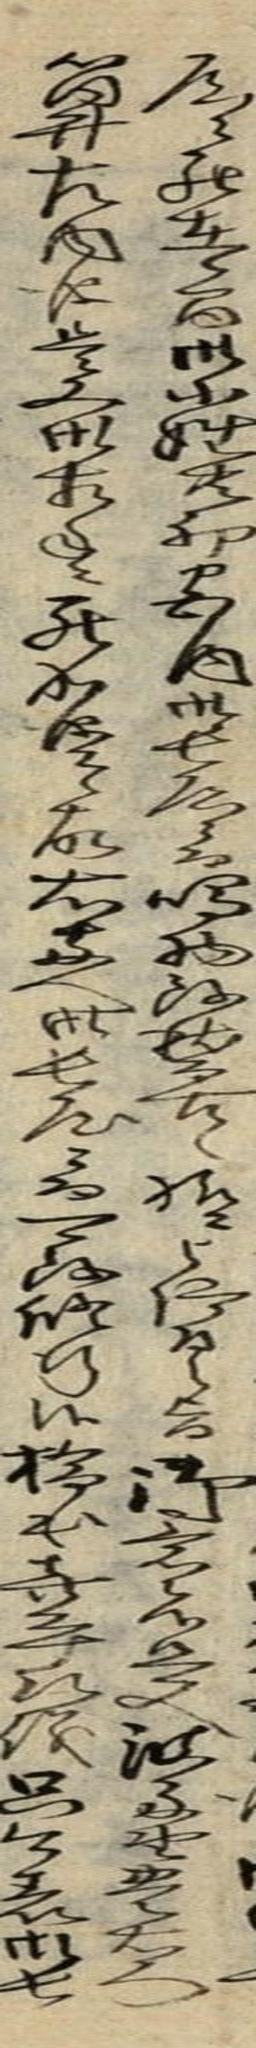筒井左内儀是又御相手に罷成儀に候故右両人御長屋にて可致修行候橋本喜平次儀只今表御長
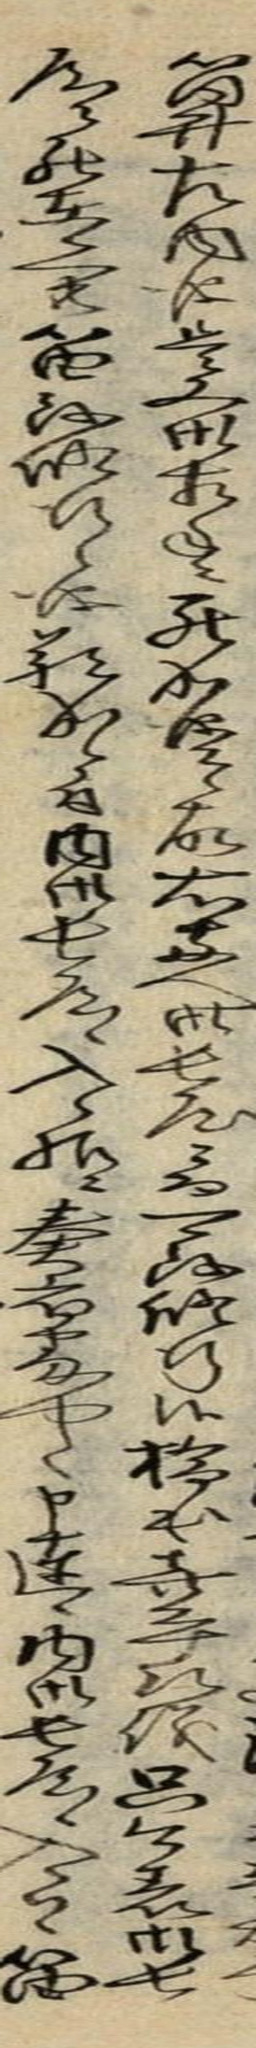屋に罷在候へ共笛致修行候儀難儀候に付内御長屋へ入候様に奏者番中へ申達候内御長屋へ入候はゝ笛
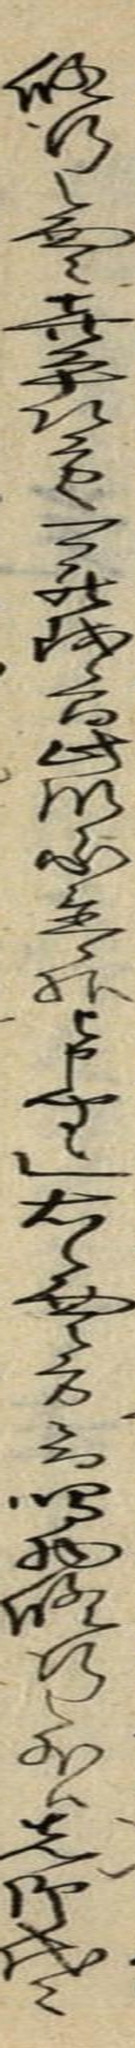修行之面々喜平次方へ可罷越候間此段承置候様被申聞候」右之面々方にて鳴物修行之外は先御代々
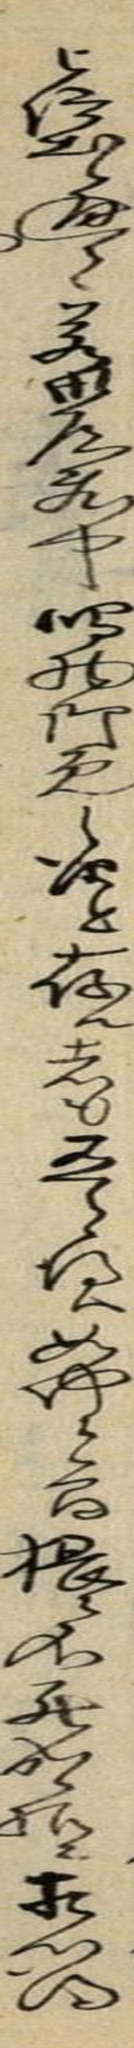被仰出候通に候若御屋敷中鳴物御免之儀と存候者も有之候得は如何に候間猥に不罷成候様に相心得
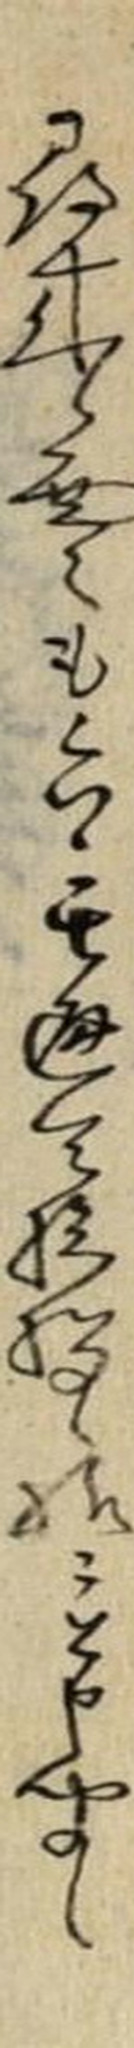尋来候面々も候はゝ其通令挨拶候様にと申聞候
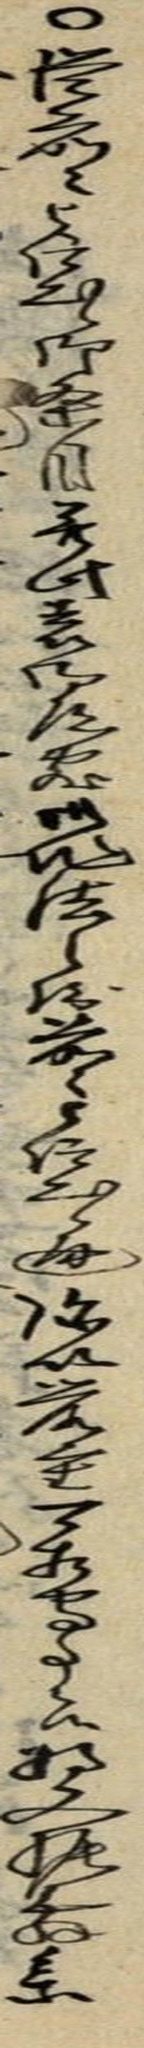〇従前々被仰出候御条目幷此表御屋敷御作法之儀前々被仰出候通弥以厳重可相守事に候将又振舞参
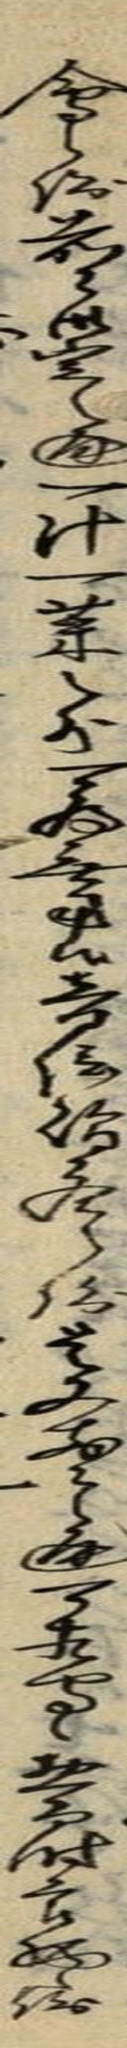会之儀前々御定之通一汁一菜之外可為無用候音信贈答之儀是又前々之通可相守候惣て時節柄之儀
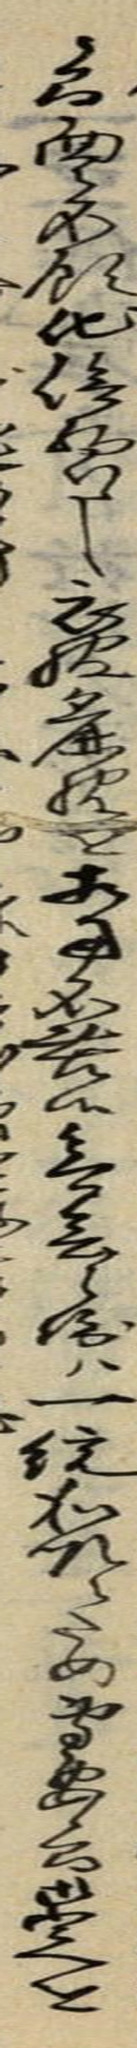候間面々不願他信酌いたし衣服麁服を相用不苦候参会之儀は一統和順之ため専要候間御定を
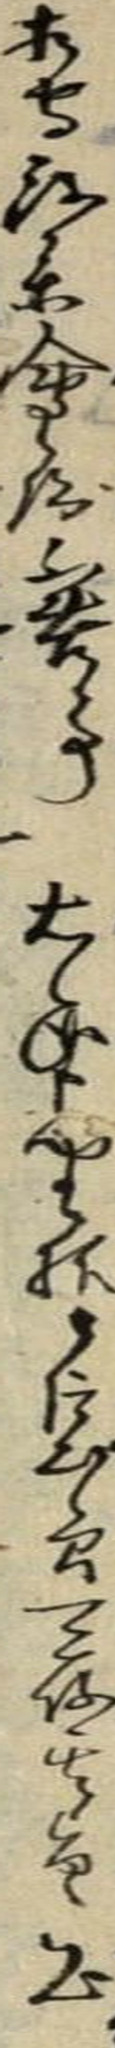相守致参会候儀不苦事右之趣申聞候様被仰出候間可存其旨候以上
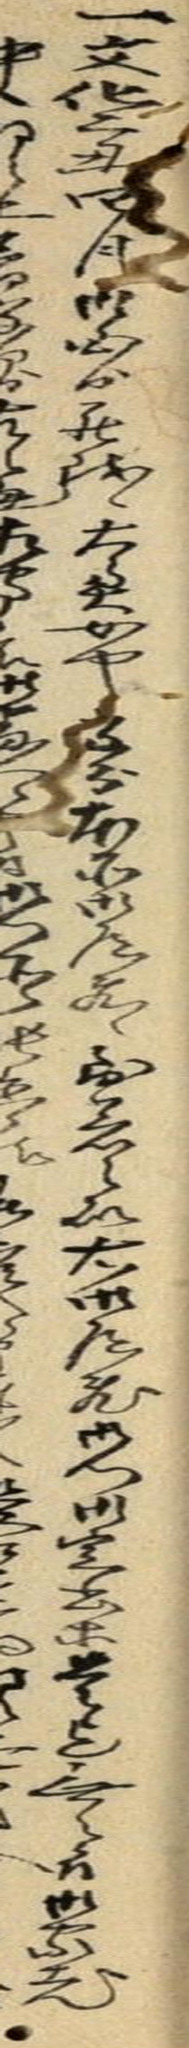一文化二丑四月御国ゟ罷越候大奥女中当分本所御屋敷へ到着之処右御屋敷御門御定書等是迄無之候付御家老
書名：三都并道中之部
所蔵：福井県文書館 Fukui Prefectural Archives
